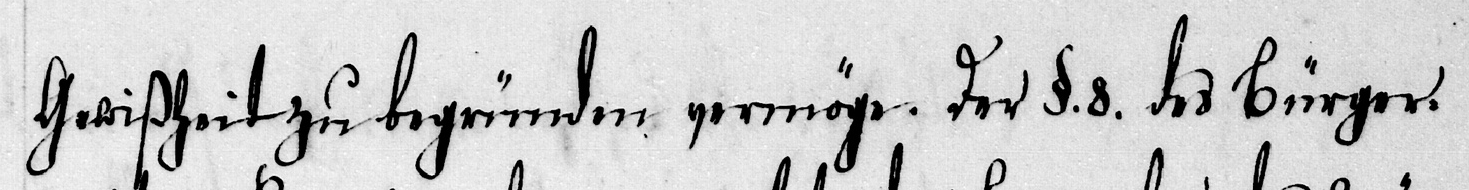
Gewißheit zu begründen vermöge. Der §. 8. des Bürger¬
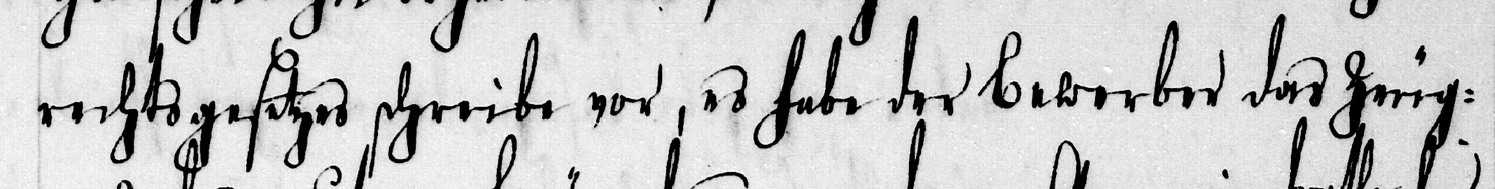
rechtsgesetzes schreibe vor, es habe der Bewerber das Zeug¬
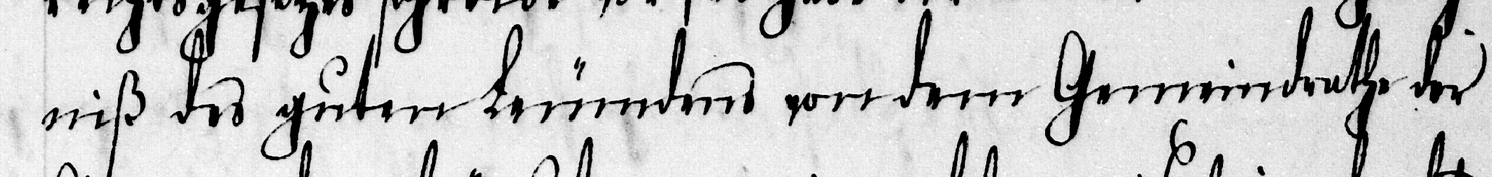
niß des guten Leumdens von dem Gemeindrathe der
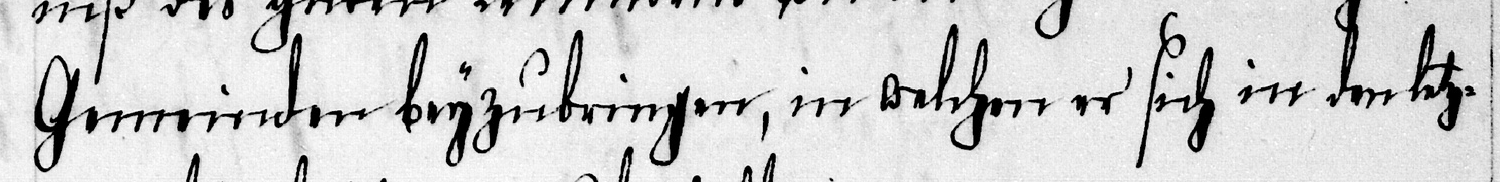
Gemeinden beyzubringen, in welchen er sich in den letz¬
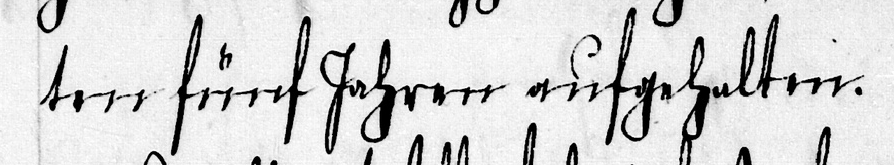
ten fünf Jahren aufgehalten.
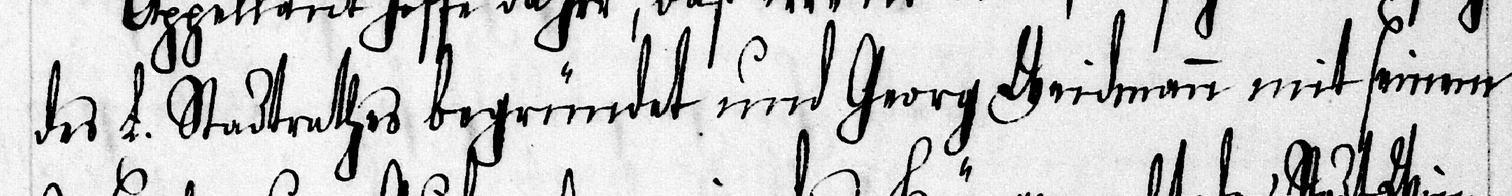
des L. Stadtrathes begründet und Georg Weidmann mit seinem
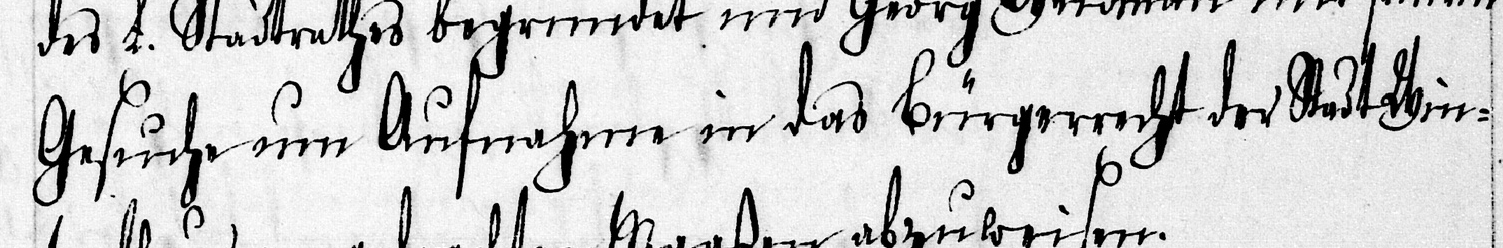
Gesuche um Aufnahme in das Bürgerrecht der Stadt Win¬
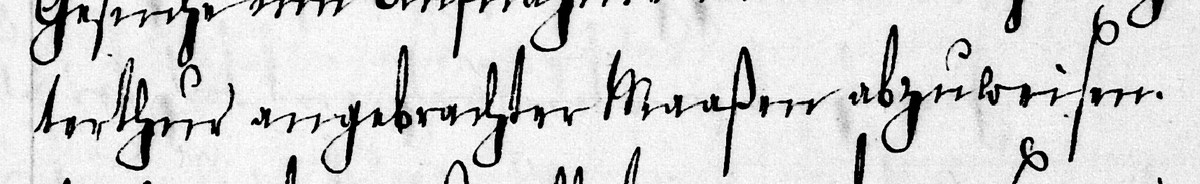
terthur angebrachter Maaßen abzuweisen.
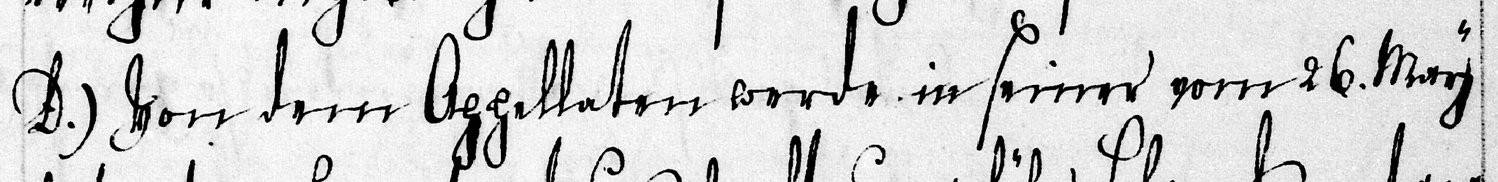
D.) Von dem Appellaten werde in seiner vom 26. May
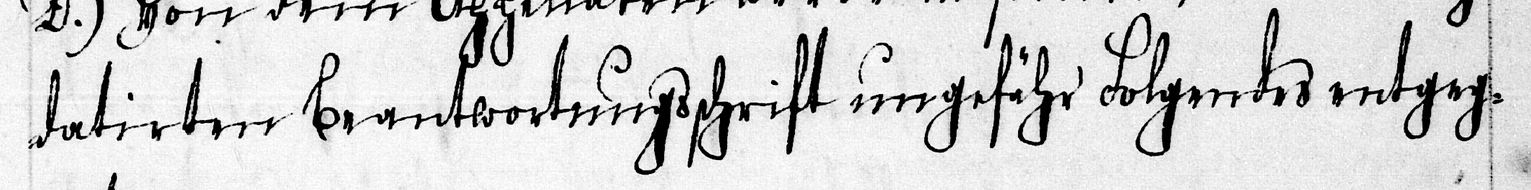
datirten Beantwortungsschrift ungefähr Folgendes entgeg¬
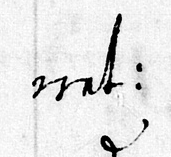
net:
